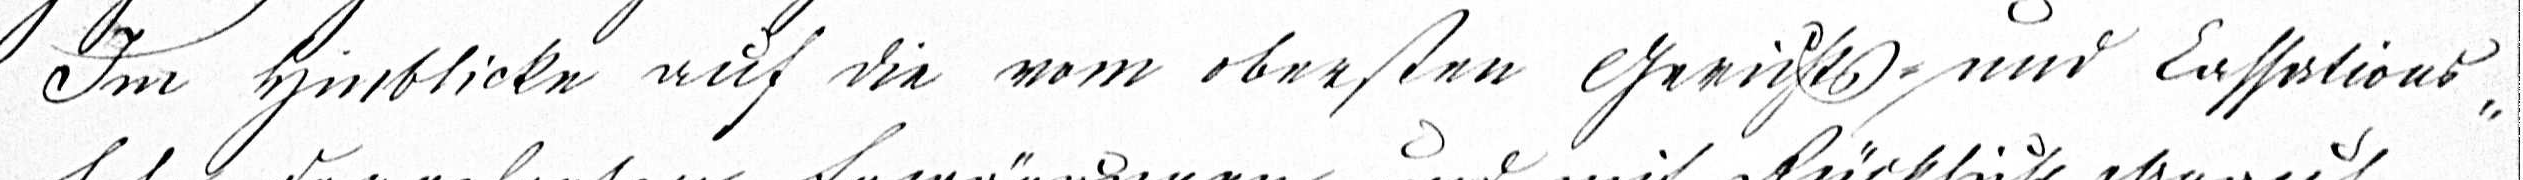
Im Hinblicke auf die vom obersten Gerichts- und Cassations¬
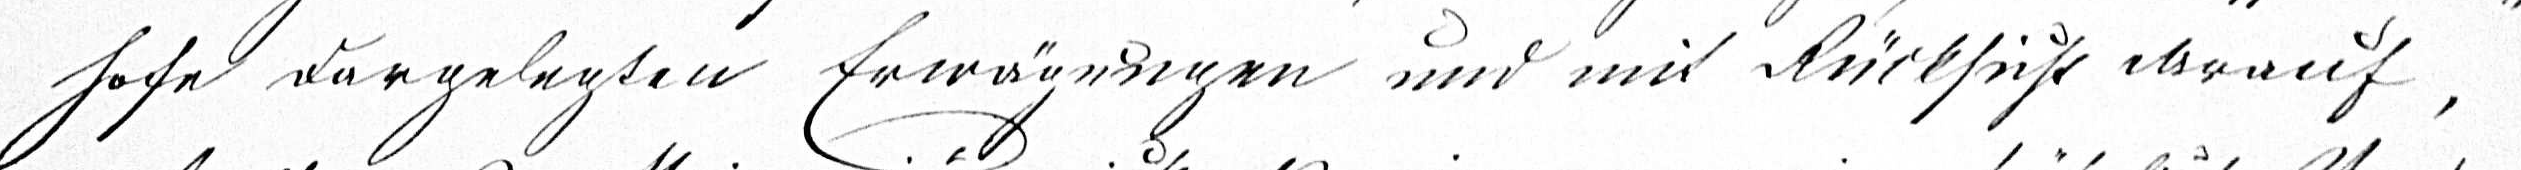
hofe dargelegten Erwägungen und mit Rücksicht darauf,
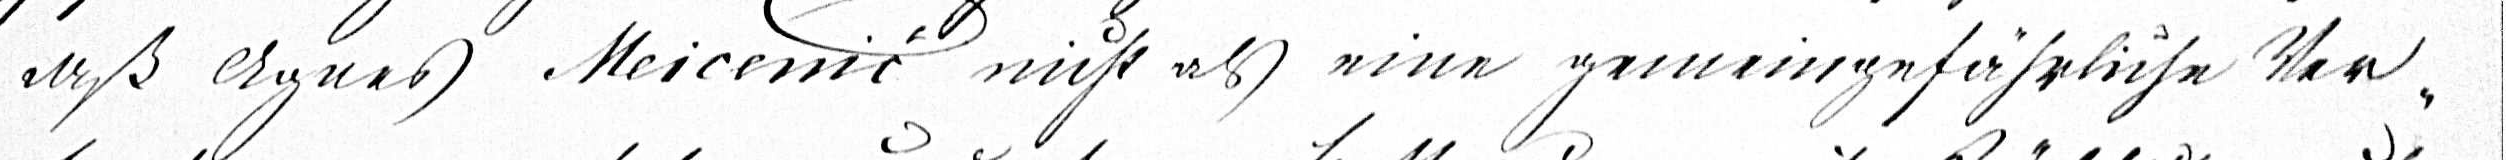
daß Agnes Meicenič nicht als eine gemeingefährliche Ver¬
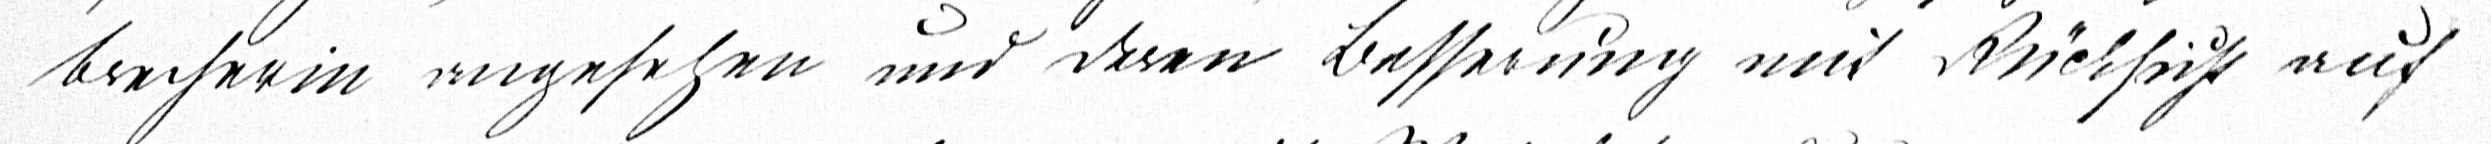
brecherin angesehen und deren Besserung mit Rücksicht auf
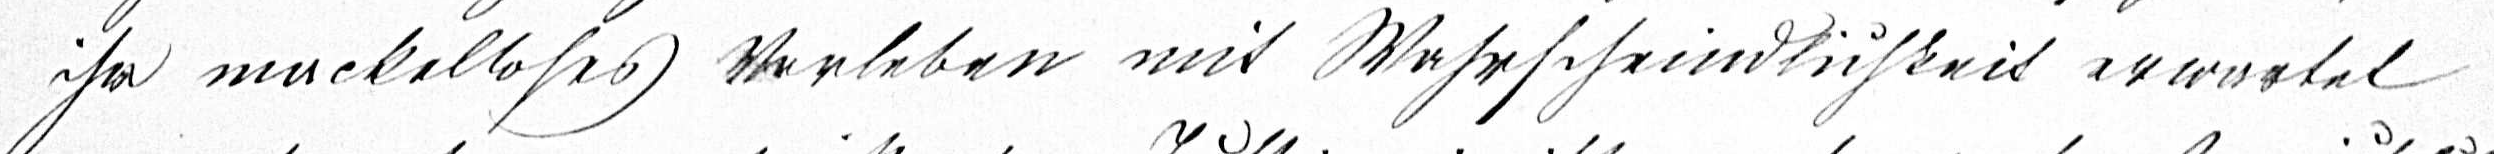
ihr mackelloses Vorleben mit Wahrscheinlichtkeit erwartet
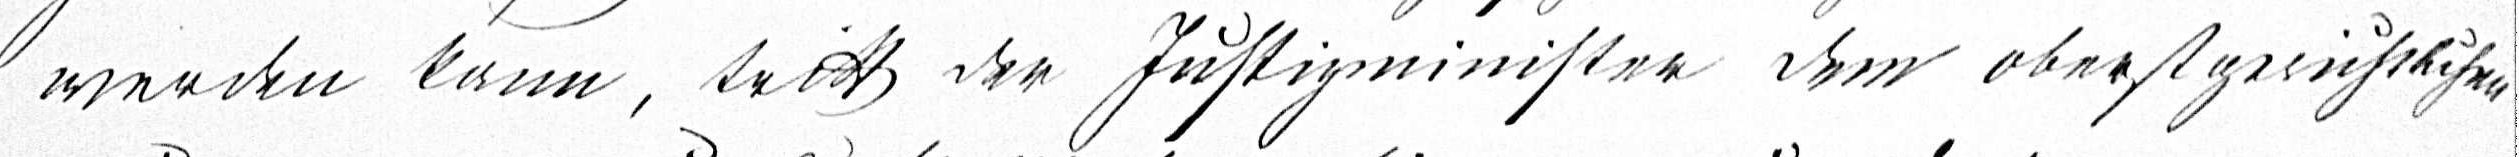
werden kann, tritt der Justizminister dem oberstgerichtlichen
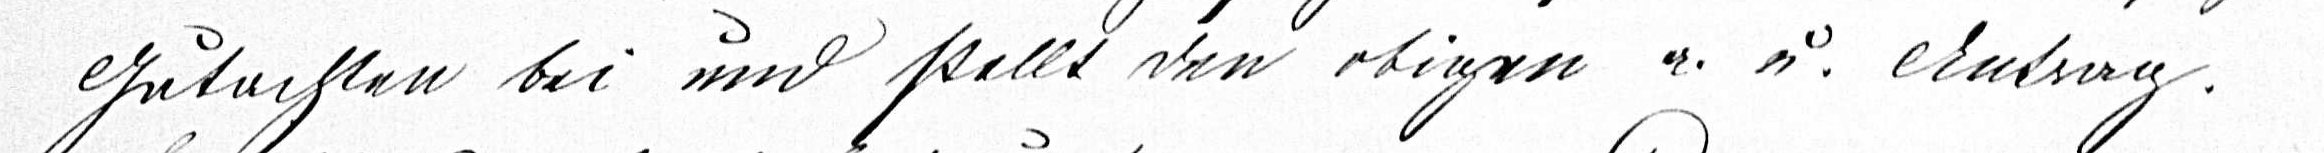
Gutachten bei und stellt den obigen a.u. Antrag.
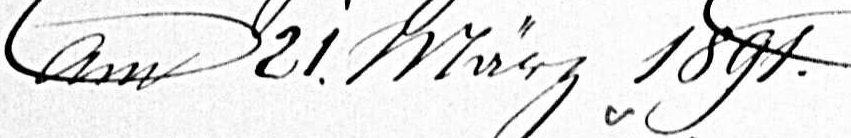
Am 21. März 1891
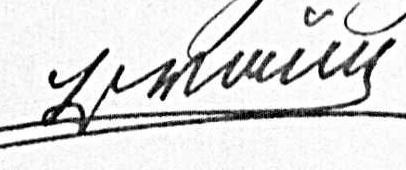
Braun
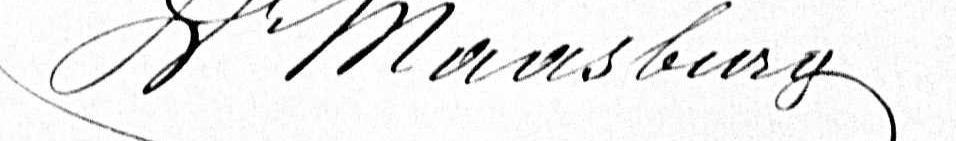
Dr. Maasburg
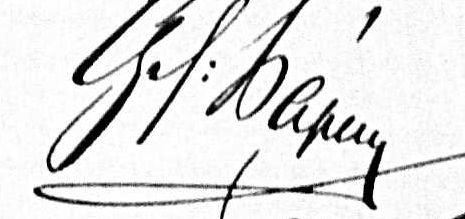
Ges:Basny
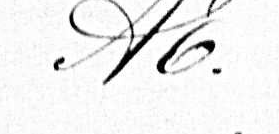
AE
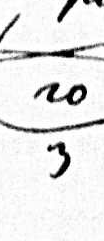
20/3
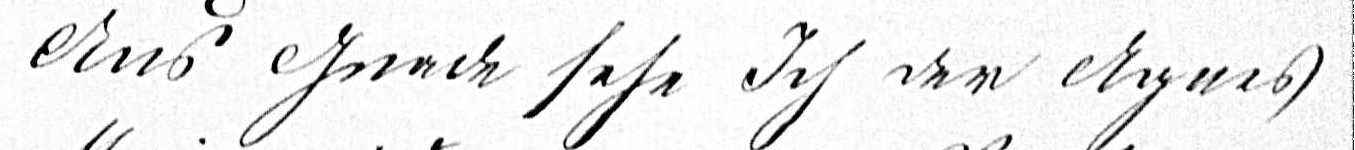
Aus Gnade sehe Ich der Agnes
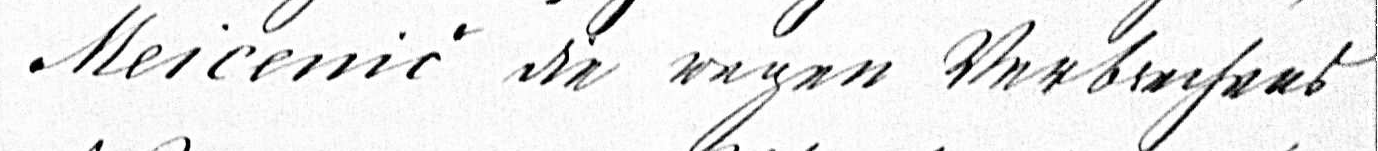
Meicenič die wegen Verbrenchens
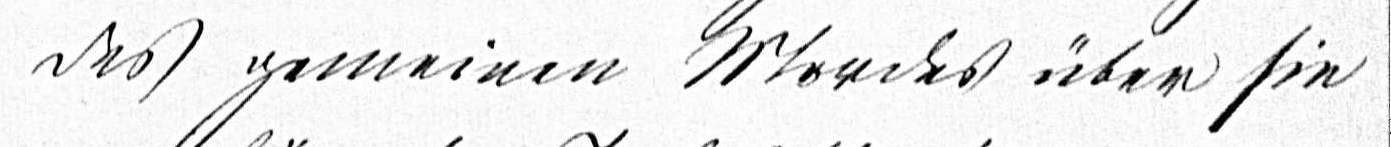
des gemeinen Mordes über sie
